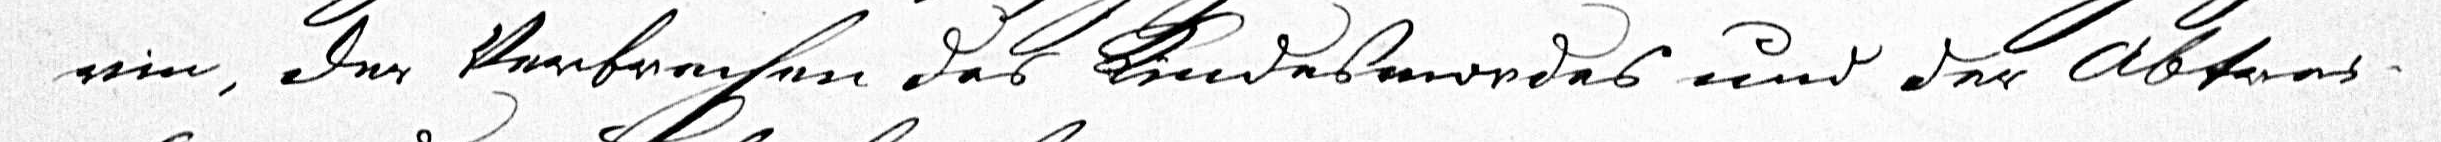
rin, den Verbrechen des Kindesmordes und der Abtrei¬
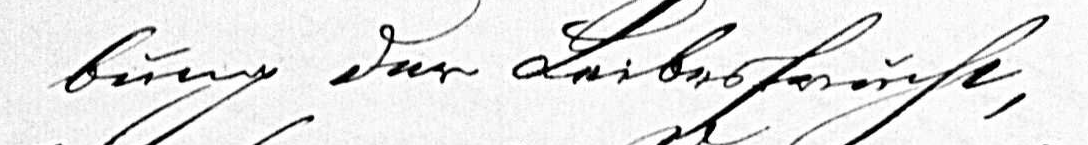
bung der Leibesfrucht,
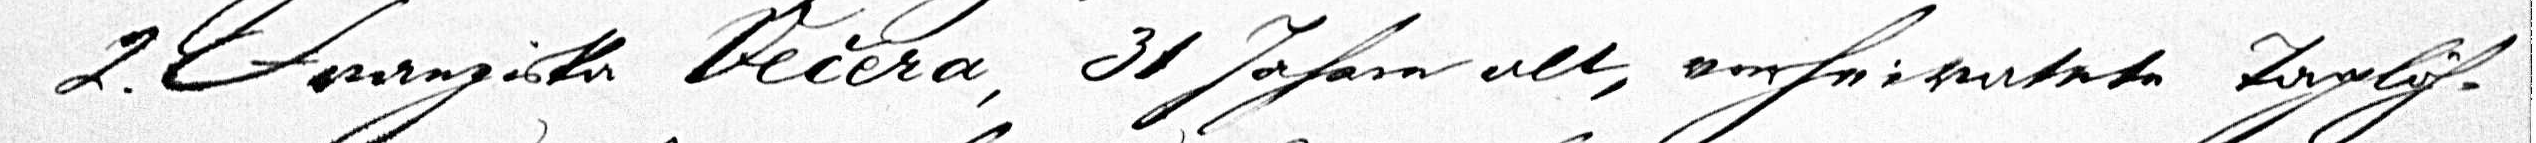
2. Franziska Večera, 31 Jahre alt, verheiratete Taglöh¬
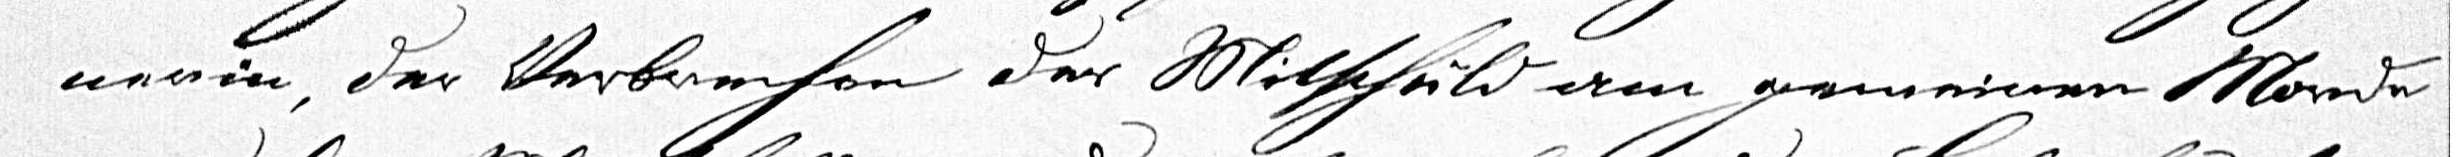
nerin, der Verbrechen der Mitschuld am gemeinen Morde
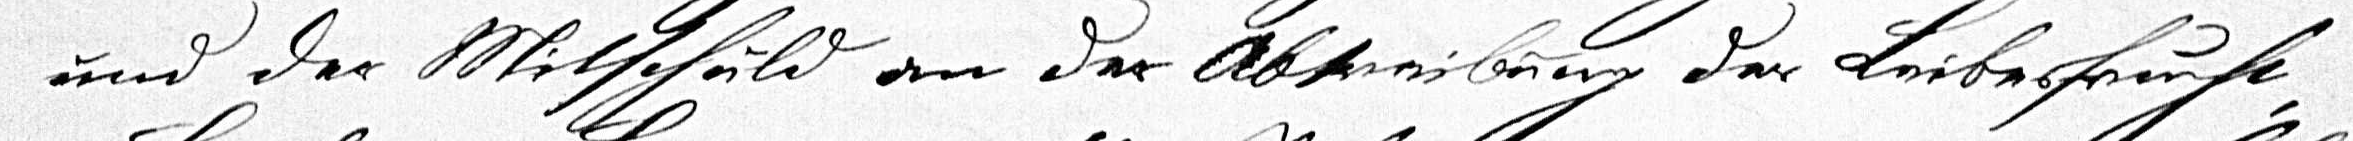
und der Mitschuld an der Abreibung der Leibesfrucht,
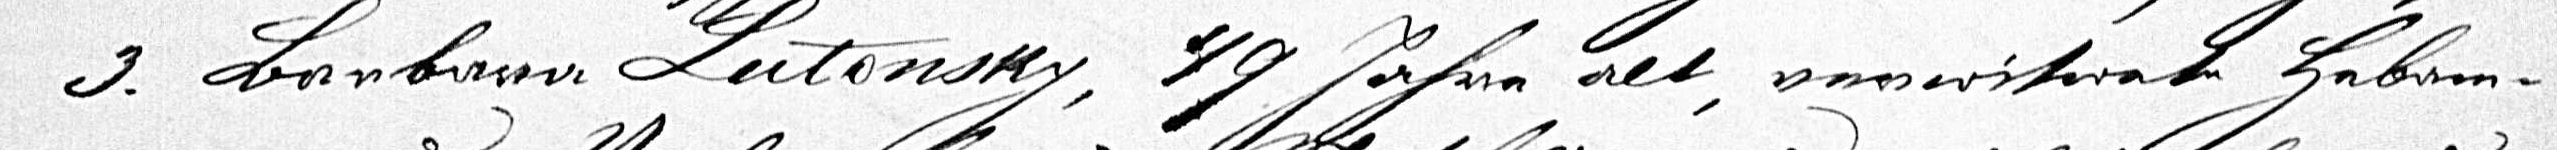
3. Barbara Lutonsky, 49 Jahre alt, verwitwet Hebam¬
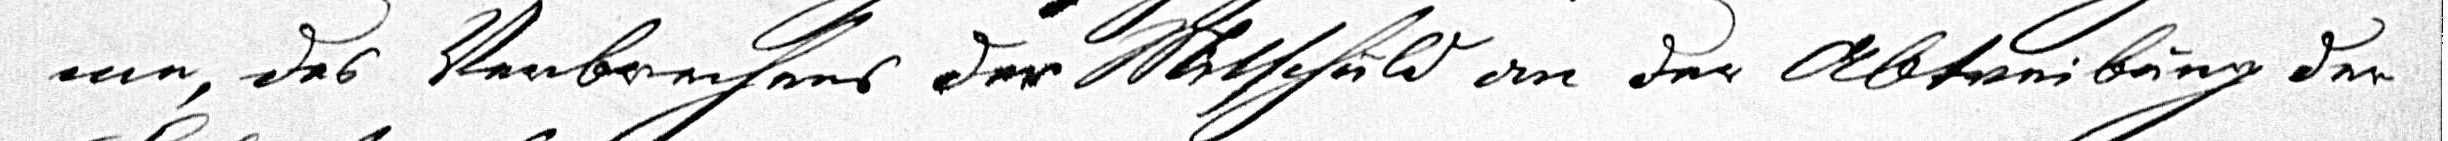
me, das Verbrechens der Mitschuld an der Abtreibung der
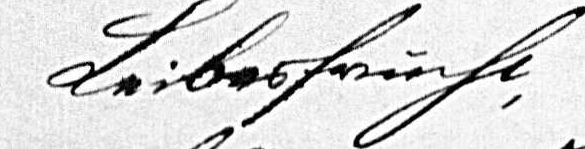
Leibesfrucht,
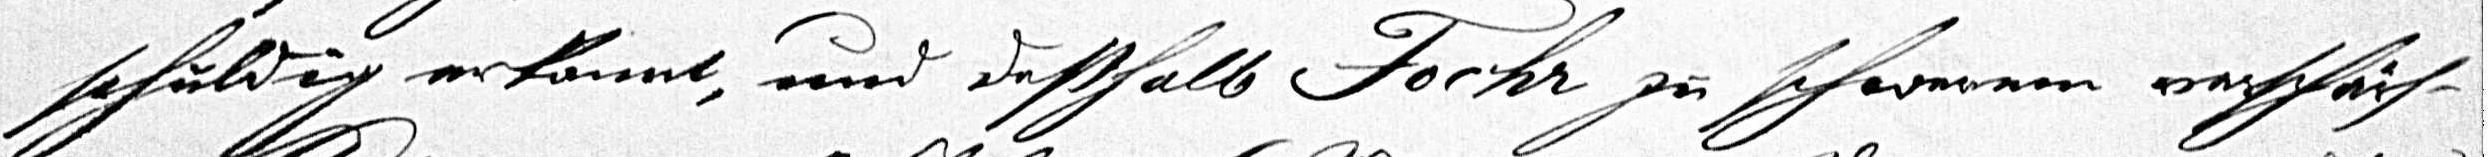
schuldig erkannt, und deshalb Foehr zu schweren verschärf¬
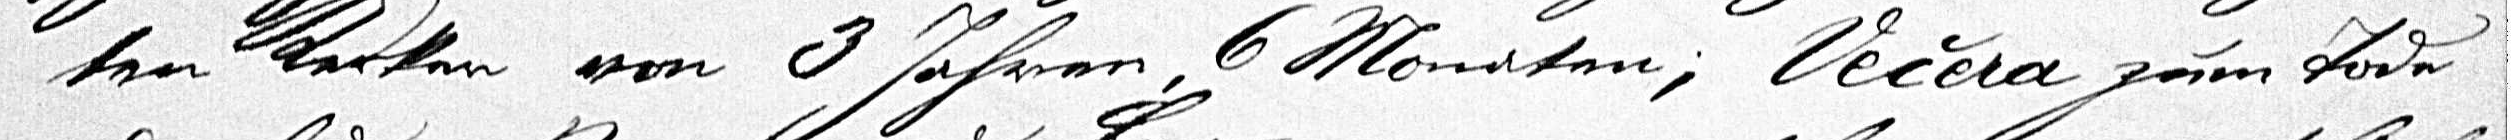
ten Kerker von 3 Jahren, 6 Monaten, Večera zum Tode
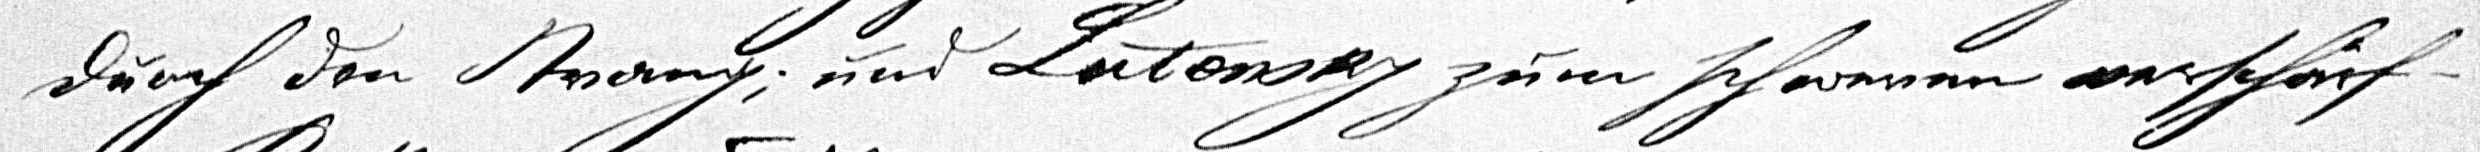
durch den Strang; und Lutonsky zum schweren verschärf¬
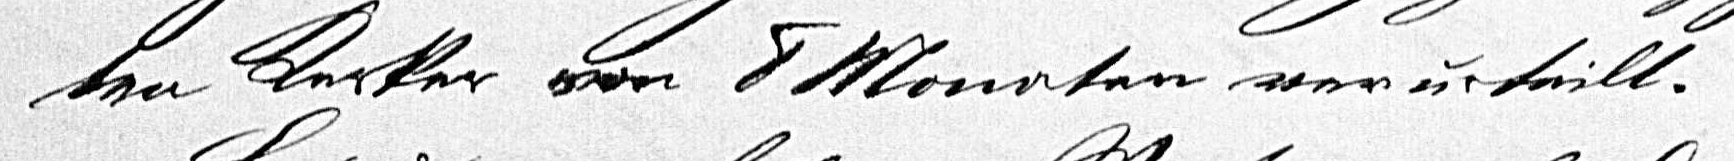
ten Kerker von 8 Monaten verurtheilt.
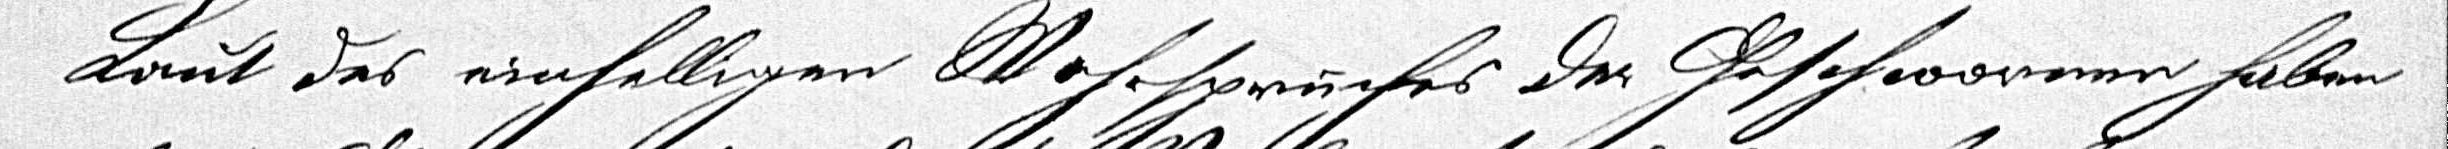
Laut das einhelligen Wahrspruches der Geschworenen haben
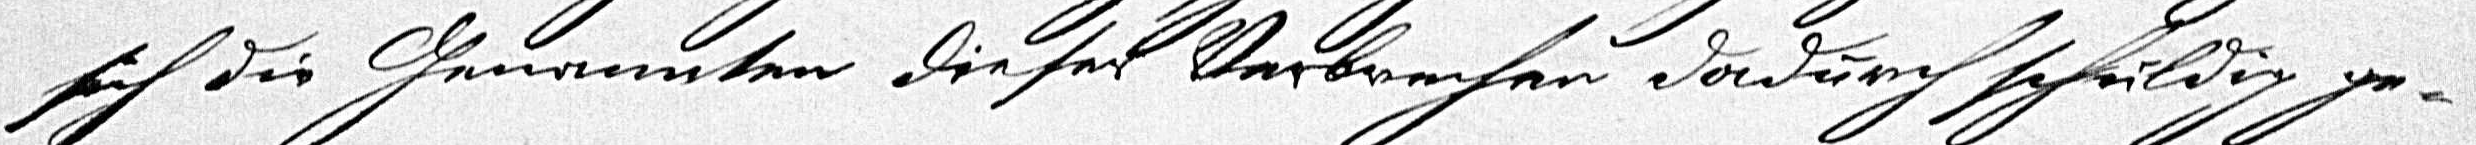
sich die Genannten dieses Verbrechen dadurch schuldig ge¬
